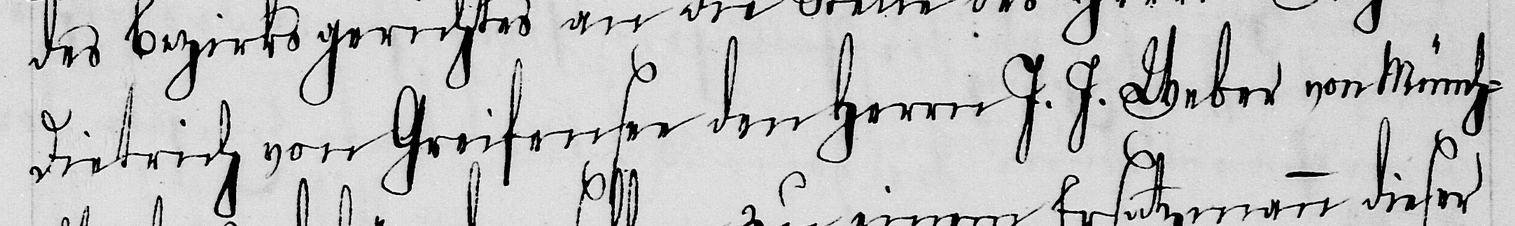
Dietrich von Greifensee den Herrn J. J. Weber von Müncha¬
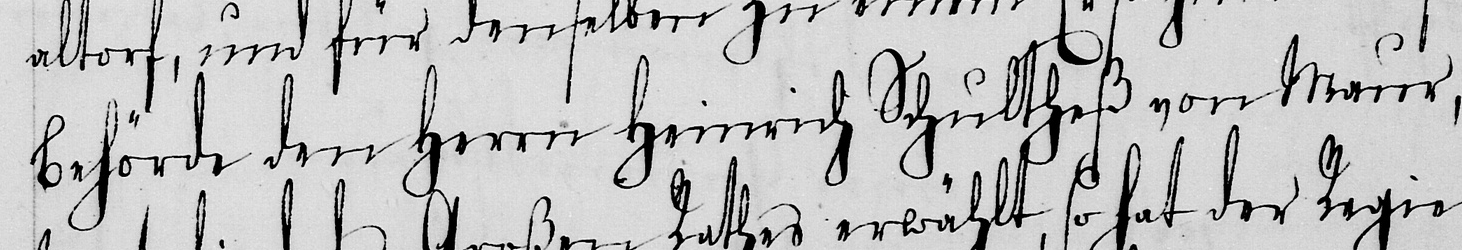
Behörde den Herrn Heinrich Schultheß von Maur,
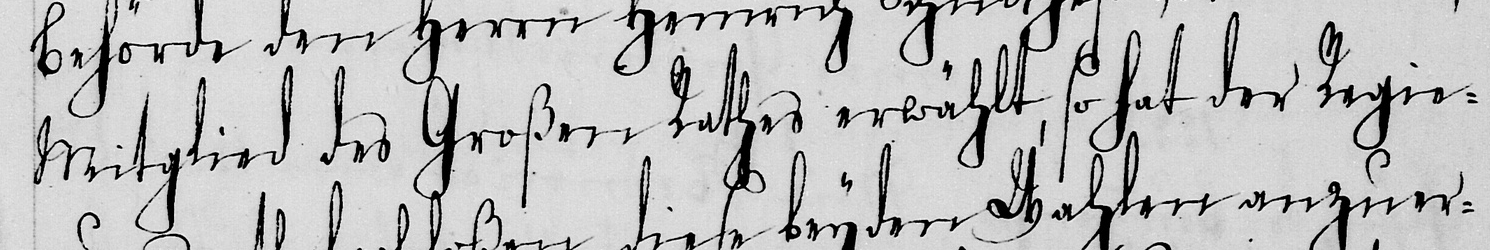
Mitglied des Großen Rathes erwählt, so hat der Regie¬
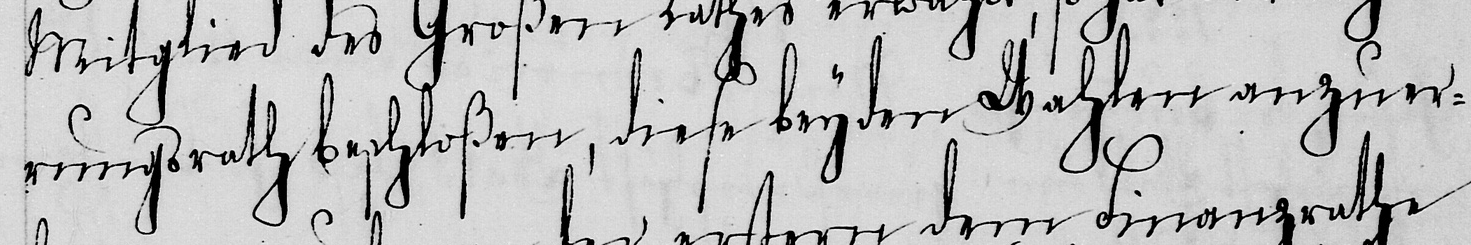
rungsrath beschloßen, diese beyden Wahlen anzuer¬
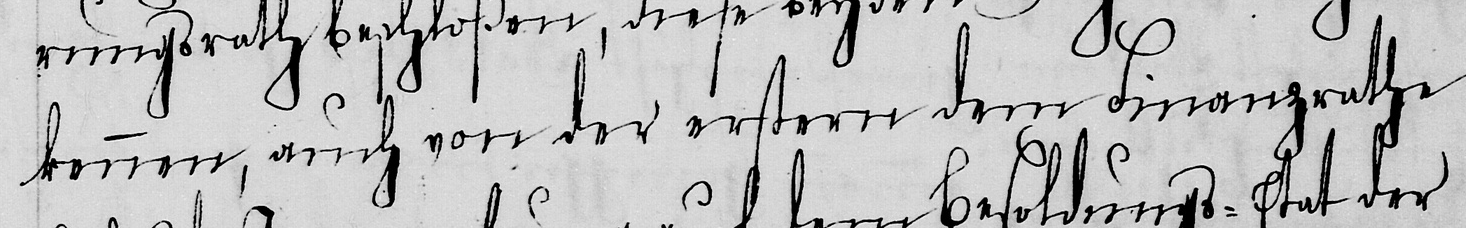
kennen, auch von der erstern dem Finanzrathe
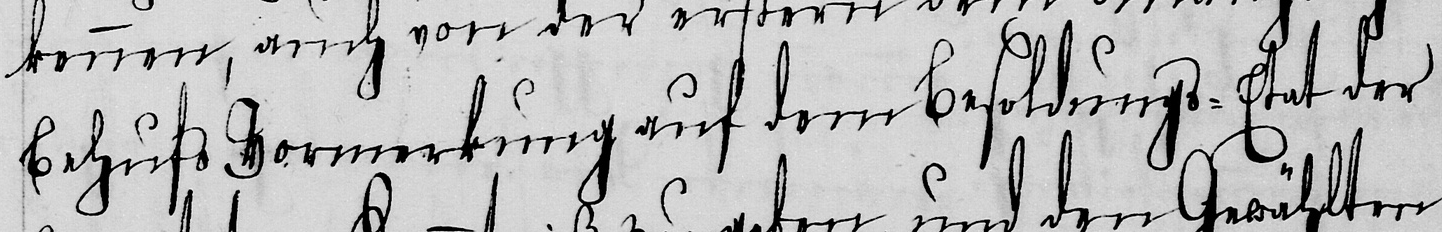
Behufs Vormerkung auf dem Besoldungs-Etat der
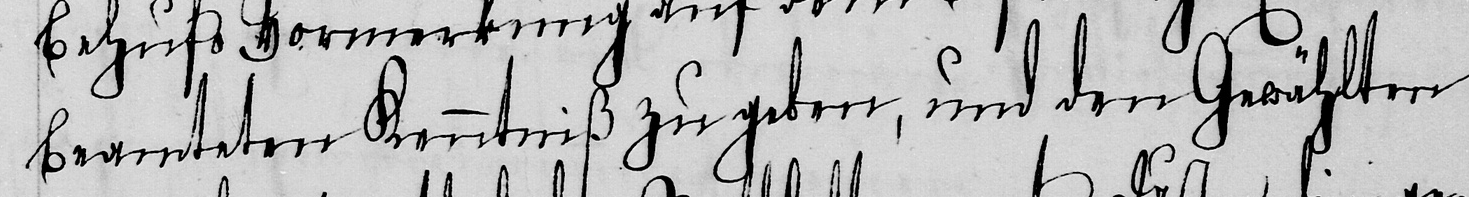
Beamteten Kenntniß zu geben, und den Gewählten
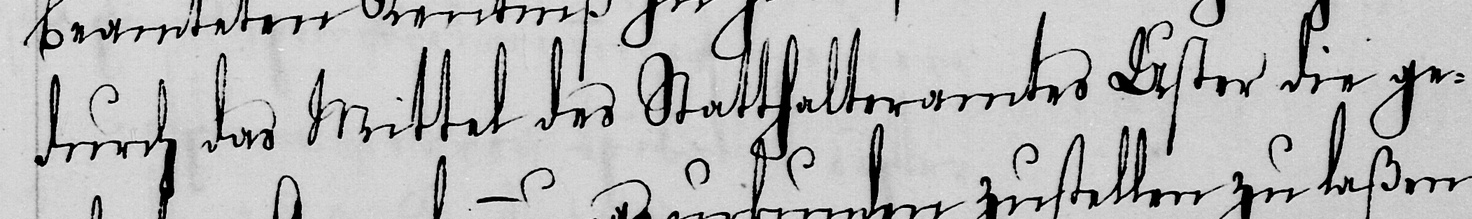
durch das Mittel des Statthalteramtes Uster die ge¬
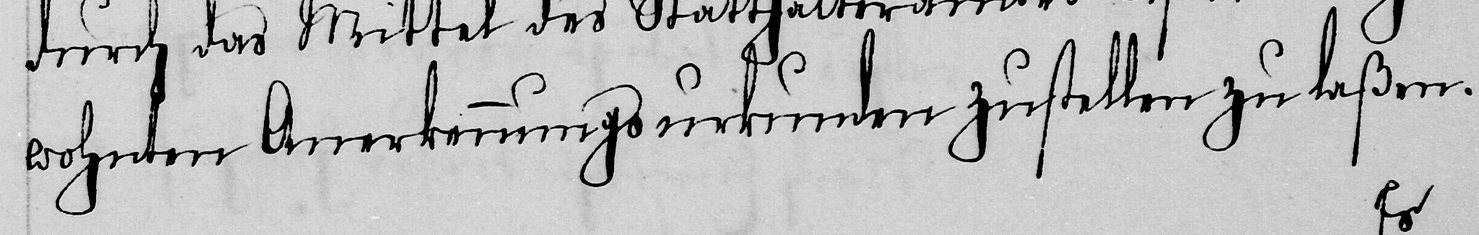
wohnten Anerkennungsurkunden zustellen zu laßen.
